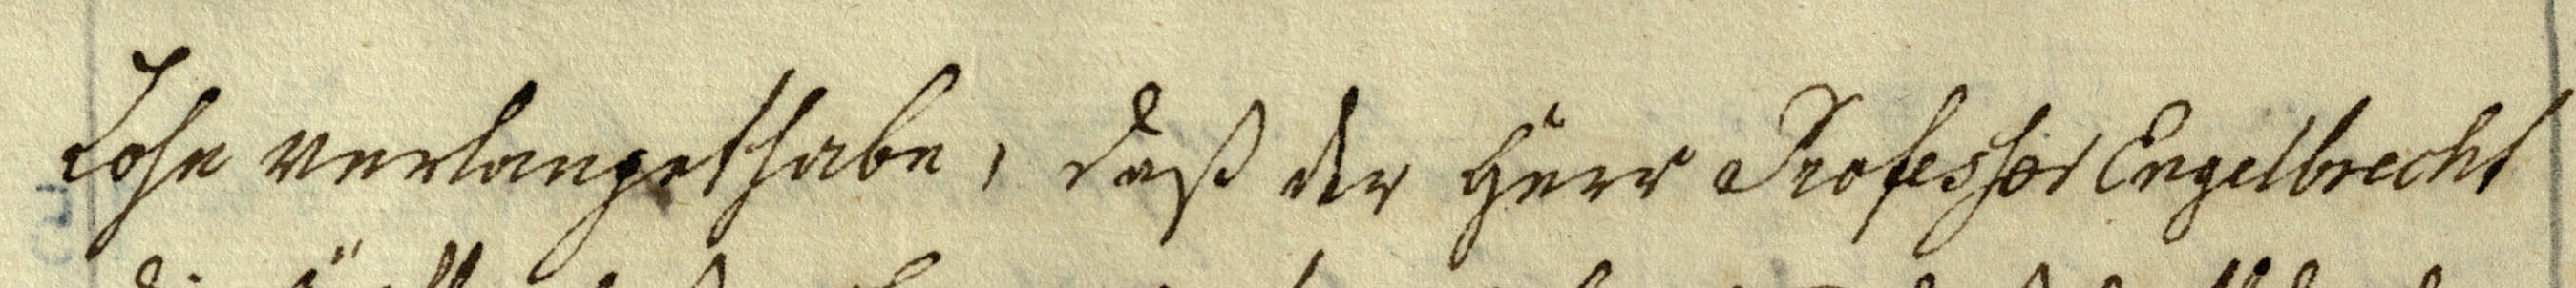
Lohn verlanget habe, daß der Herr Professor Engelbrecht
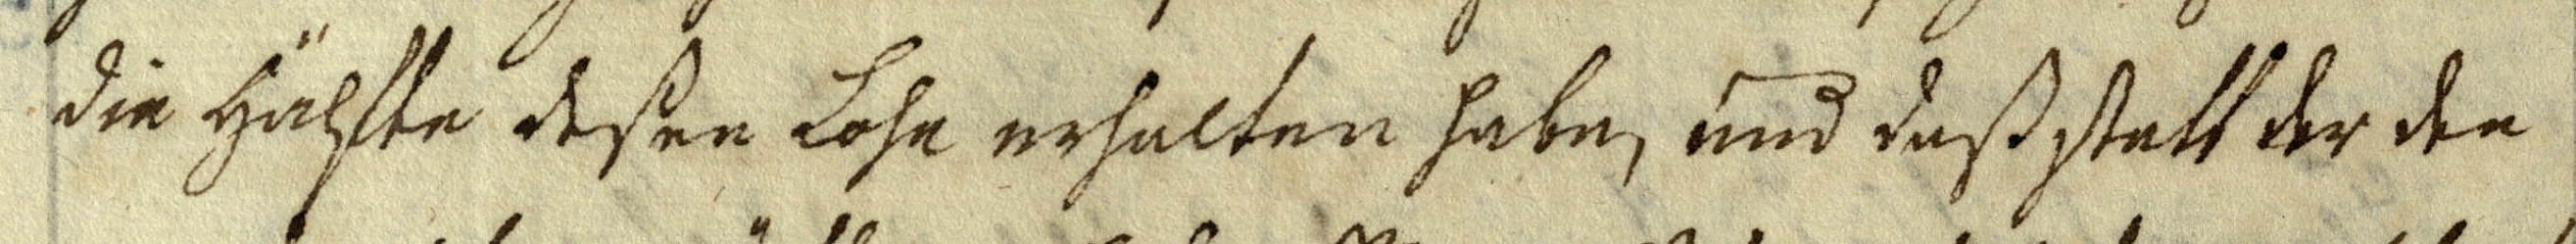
die Hälfte deßen Lohn erhalten habe, und daß statt der den
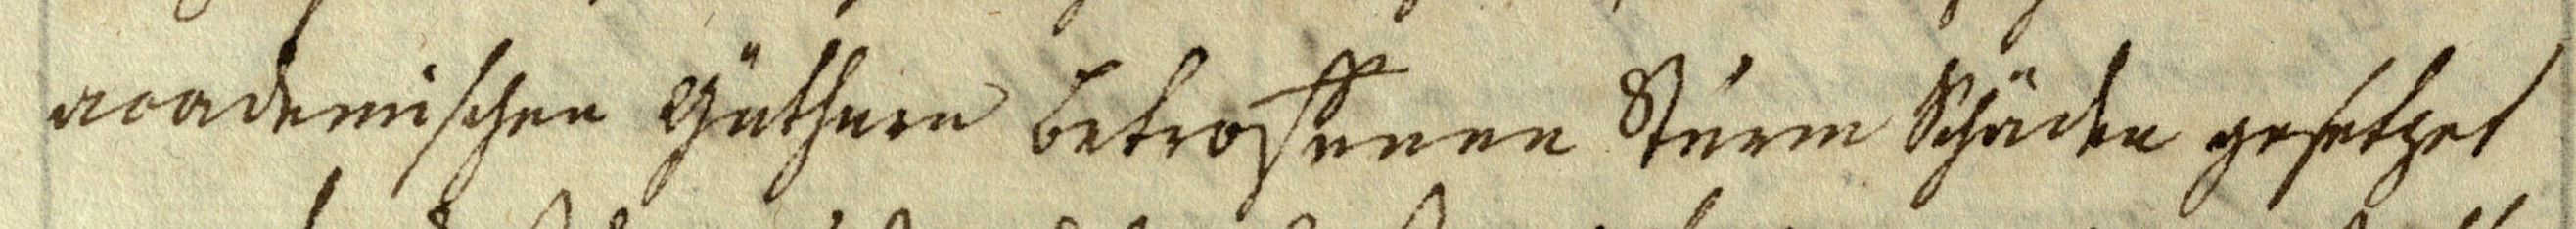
academischen Güthern betroffenen Sturm Schäden gesetzet
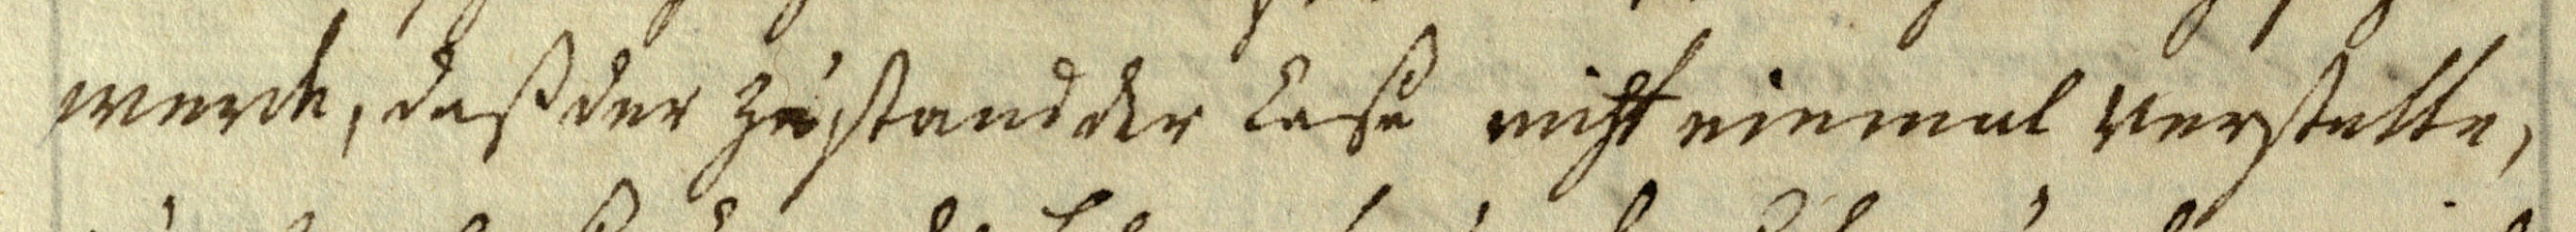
werde, daß der Zustand der Caße nicht einmal verstatte,
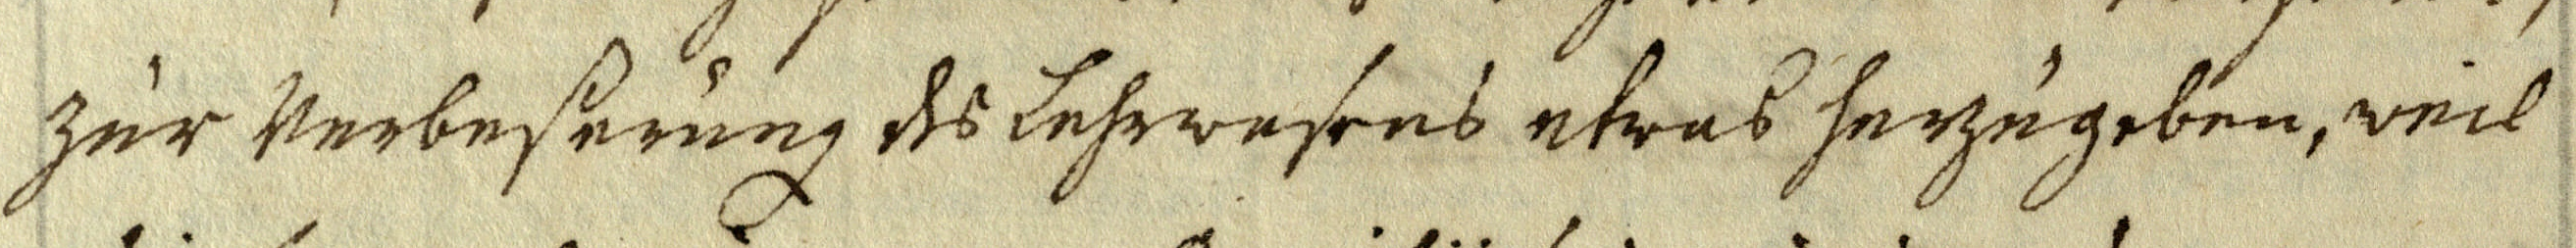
zur Verbeßerung des Lehrwesens etwas herzugeben, weil
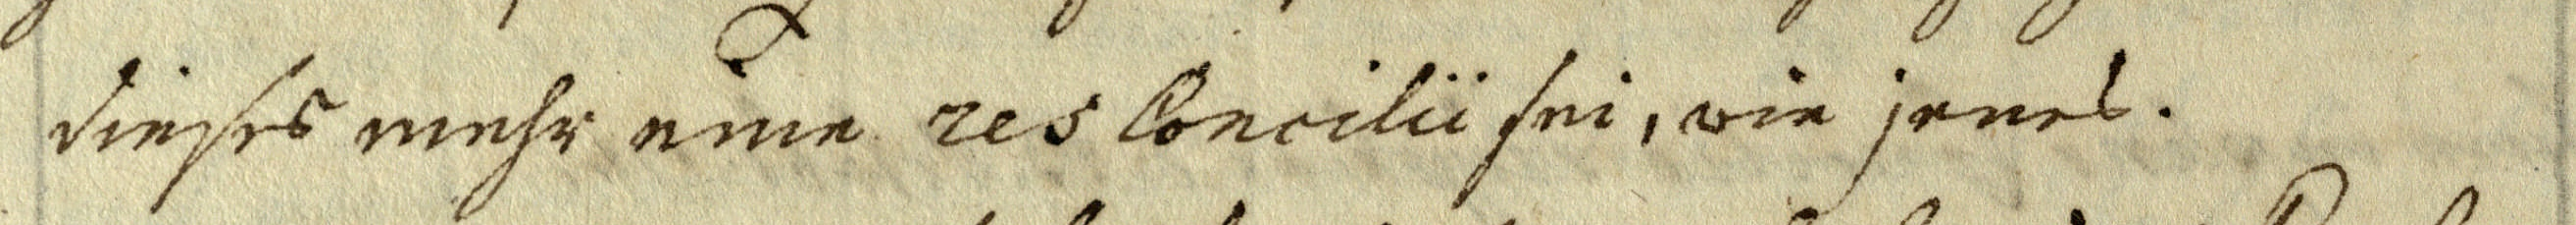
dieses mehr eine res Concilii sei, wie jenes.
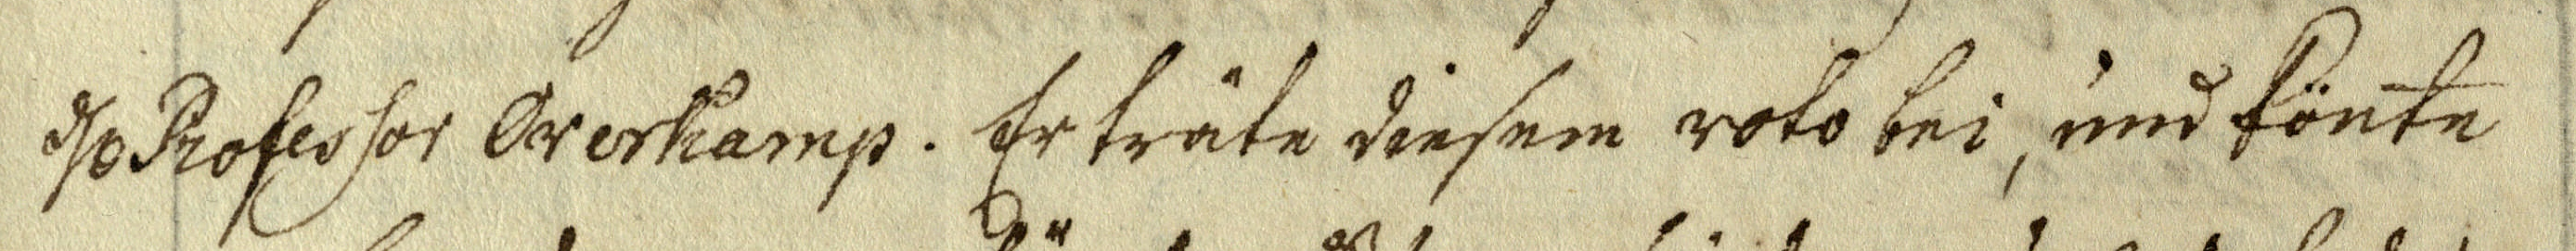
dh Professor Overkamp. Er träte diesem voto bei, und könte
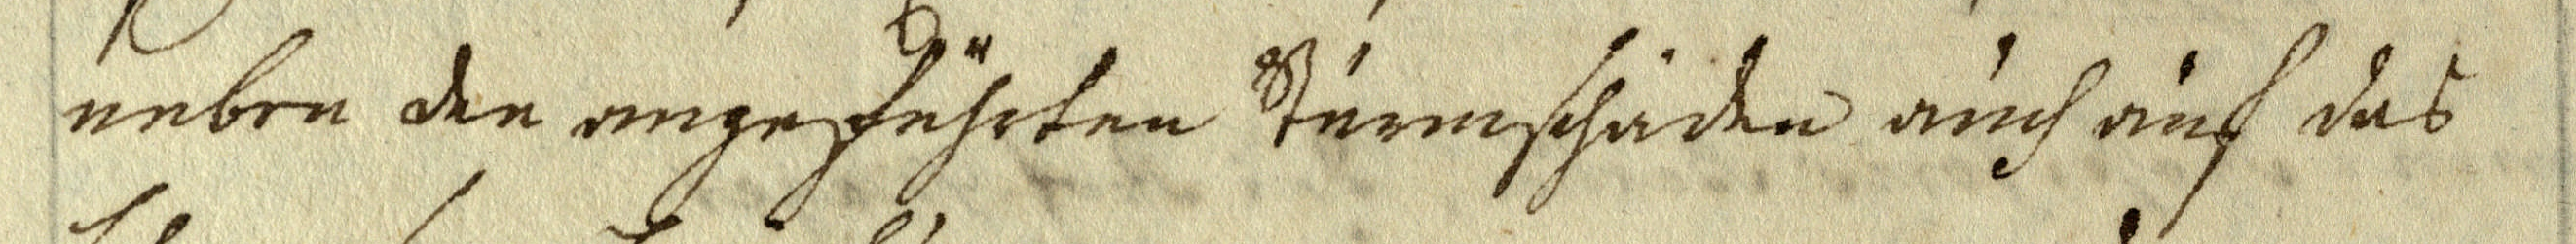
neben den angeführten Sturmschäden auch auf das
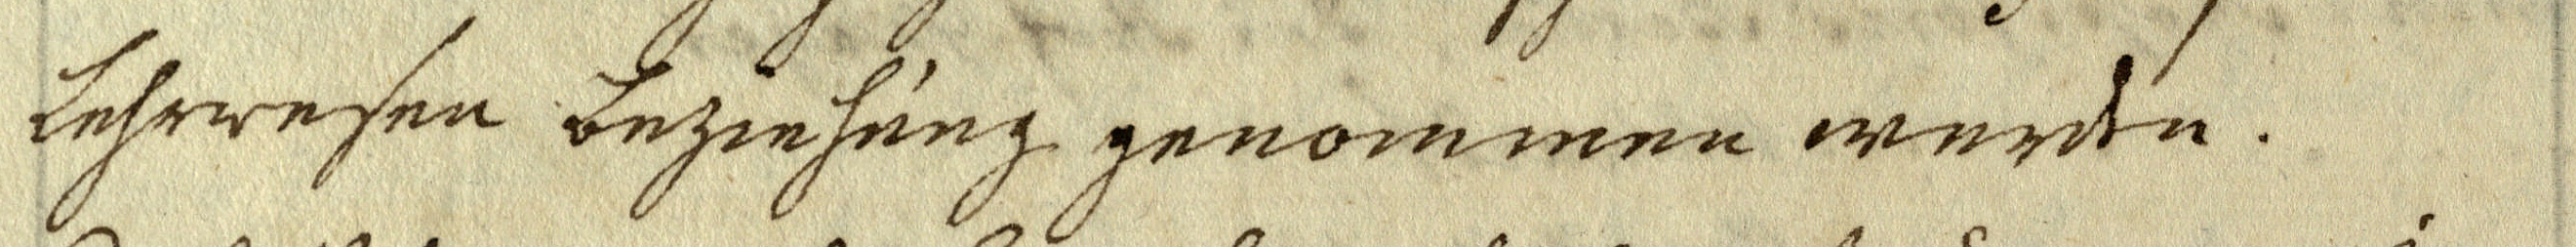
Lehrwesen Beziehung genommen werden.
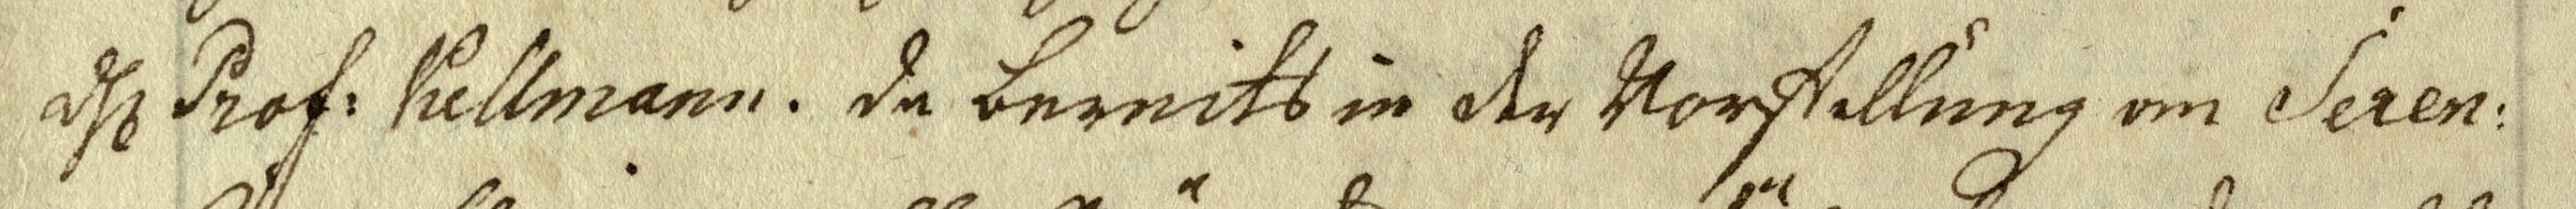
dh Prof: Kellmann. da bereits in der Vorstellung an Seren:
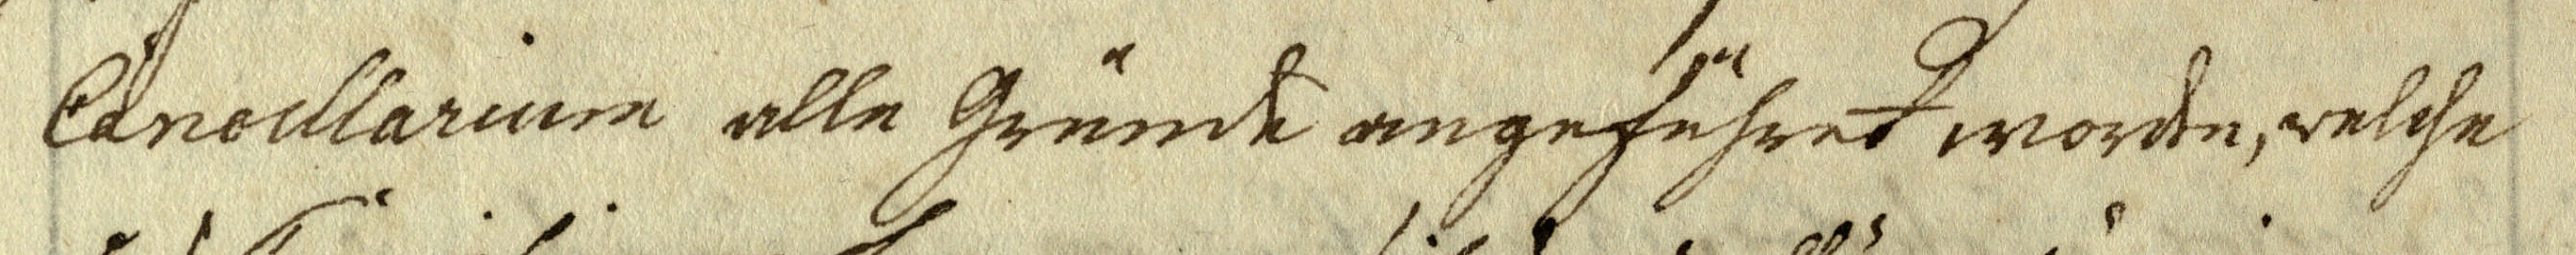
Cancellarium alle Gründe angeführet worden, welche
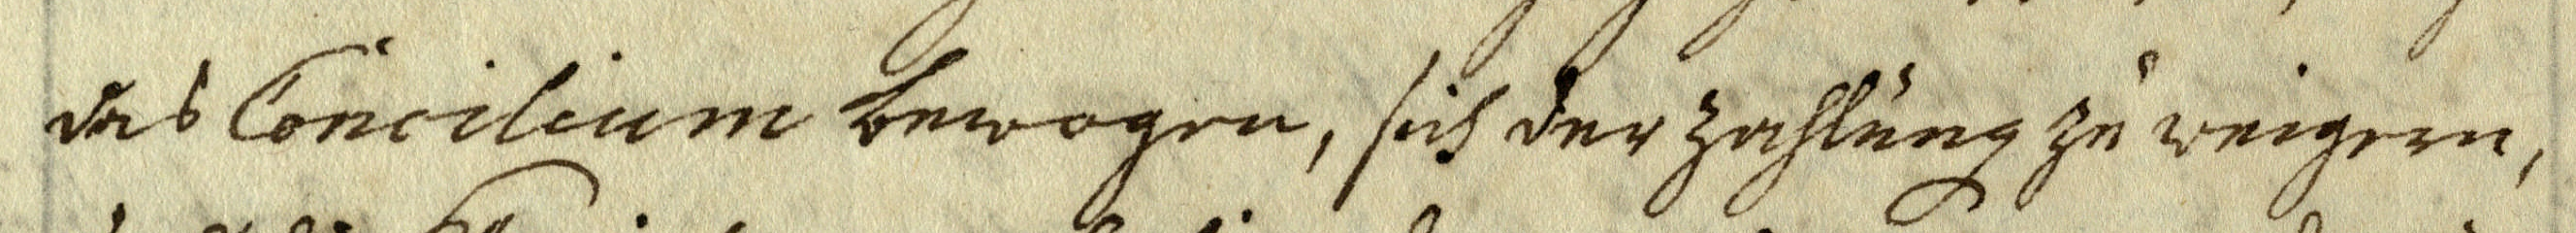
das Concilium bewogen, sich der Zahlung zu weigern,
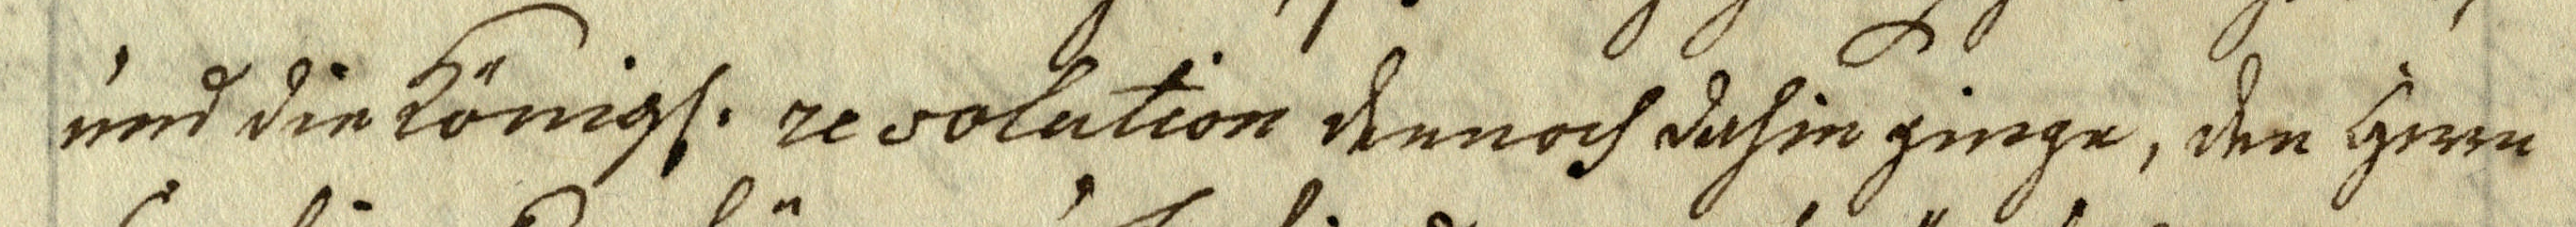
und die Königl: resolution dennoch dahin ginge, den Herrn
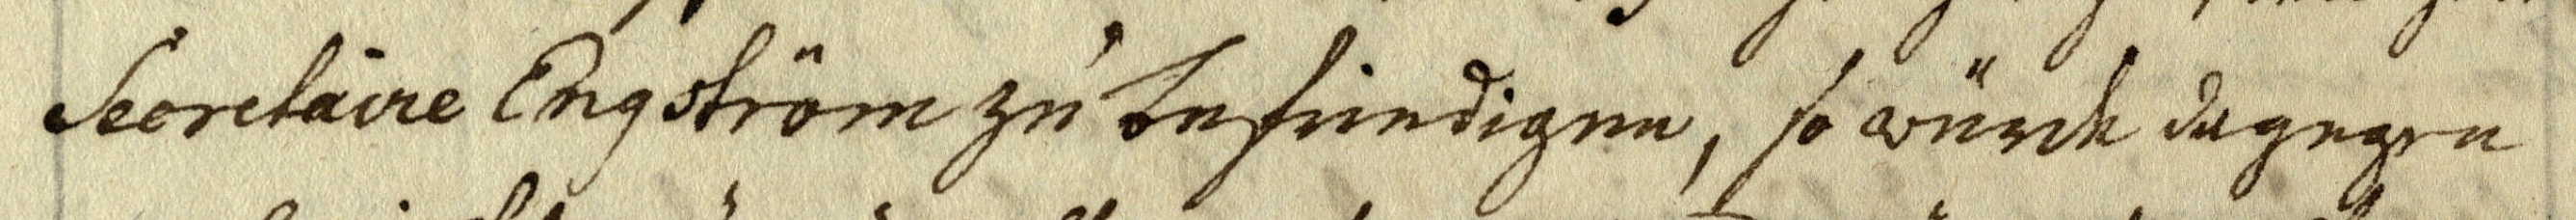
Secretaire Engström zu befriedigen, so würde dagegen
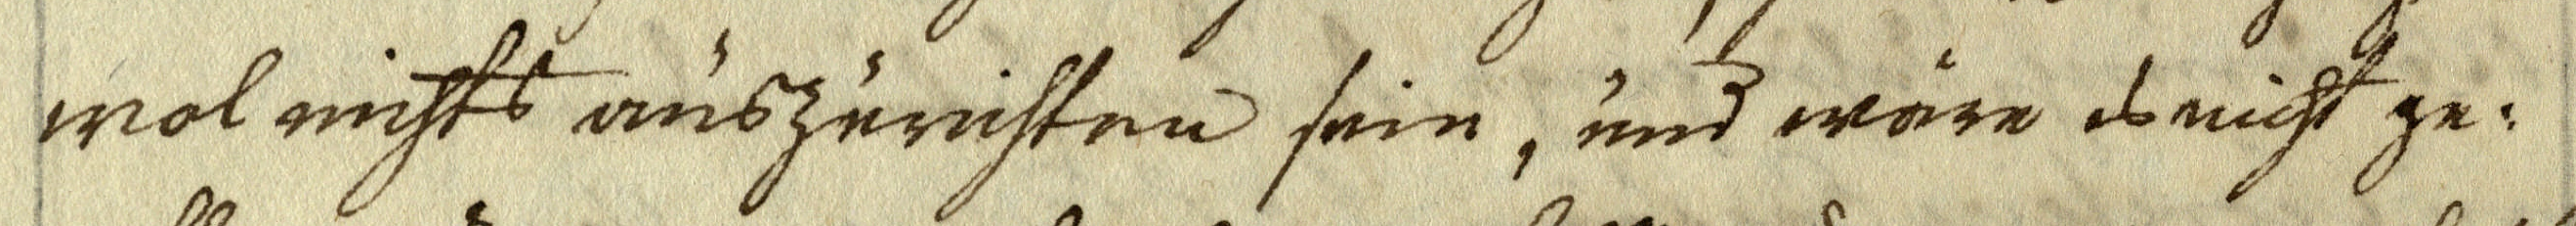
wol nichts auszurichten sein, und wäre es nicht ge¬
